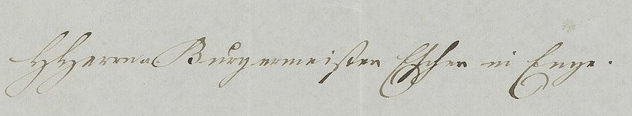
HHerrn a. Burgermeister Escher in Enge.
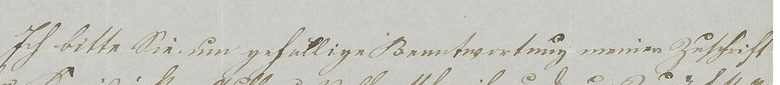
Ich bitte Sie um gefällige Beantwortung meiner Zuschrift
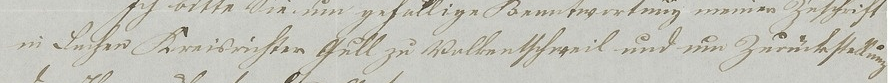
in Sachen Kreisrichter Gull zu Volkentschweil und um Zurückstellung
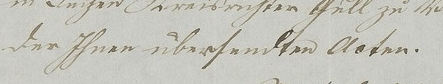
der Ihnen übersandten Acten.
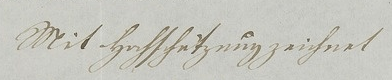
Mit Hochschätzung zeichnet
